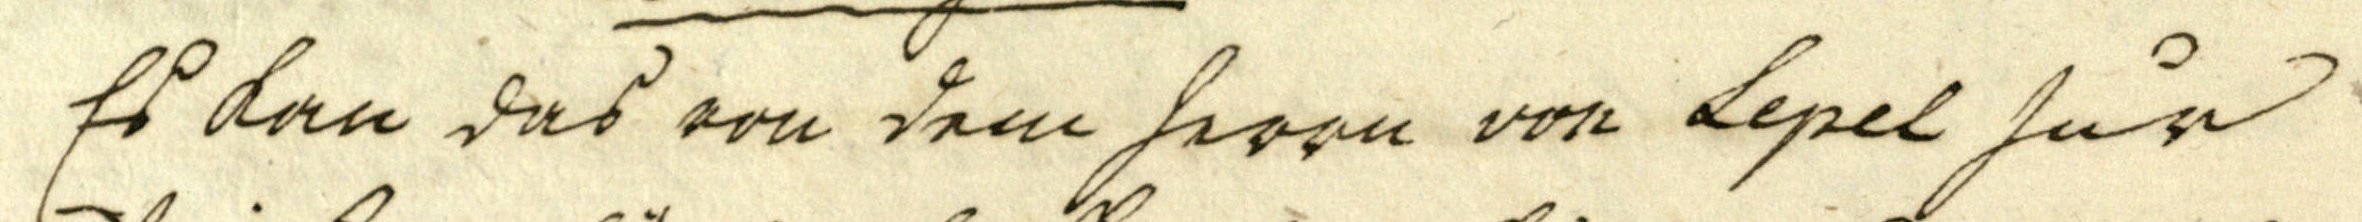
Es kan das von dem Herrn von Lepel zur
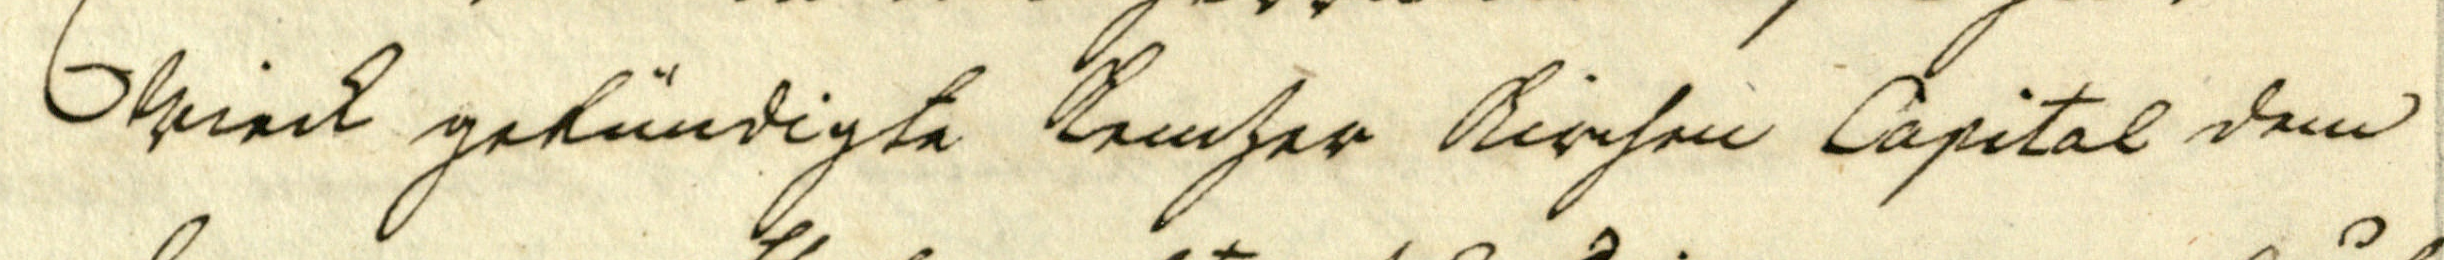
Wieck gekündigte Kemzer Kirchen Capital dem
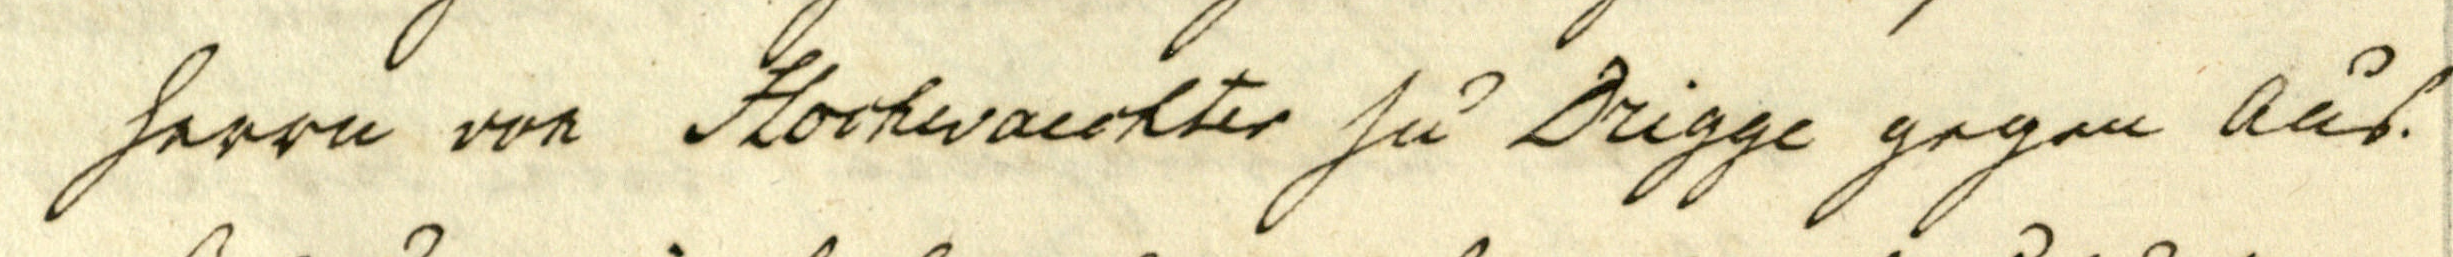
Herrn von Hochwächter zu Drigge gegen Aus¬
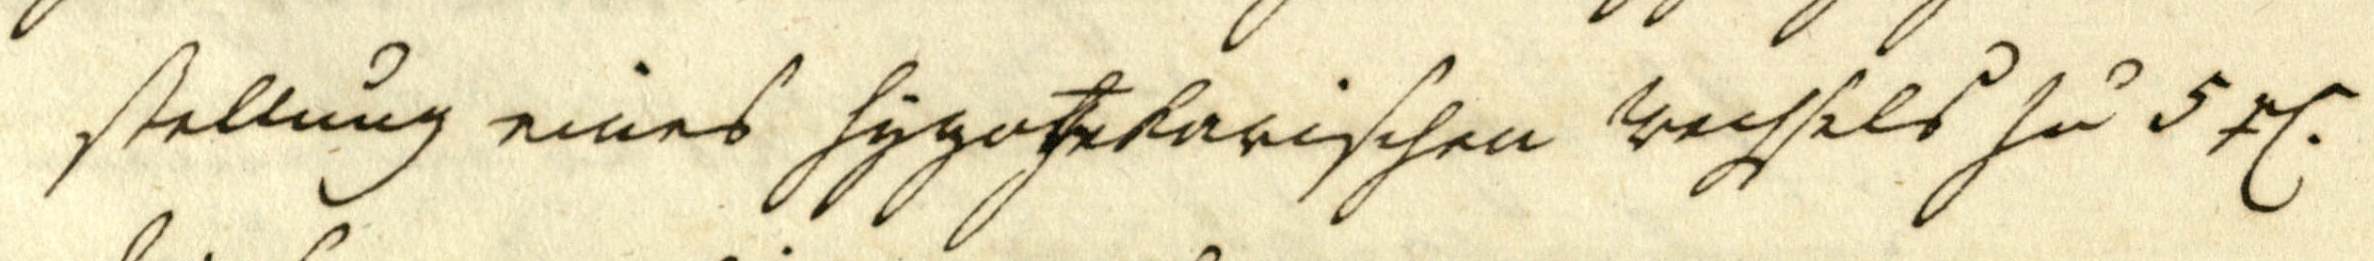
stellung eines hypothekarischen Wechsels zu 5 r.
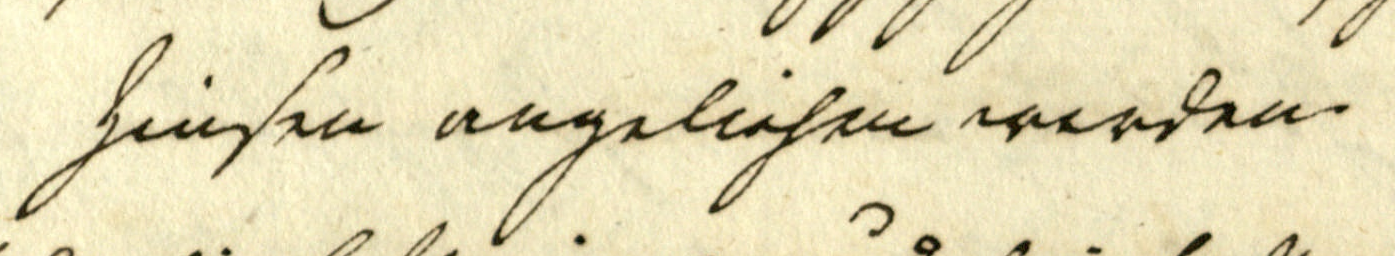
Zinsen angeliehen werden.
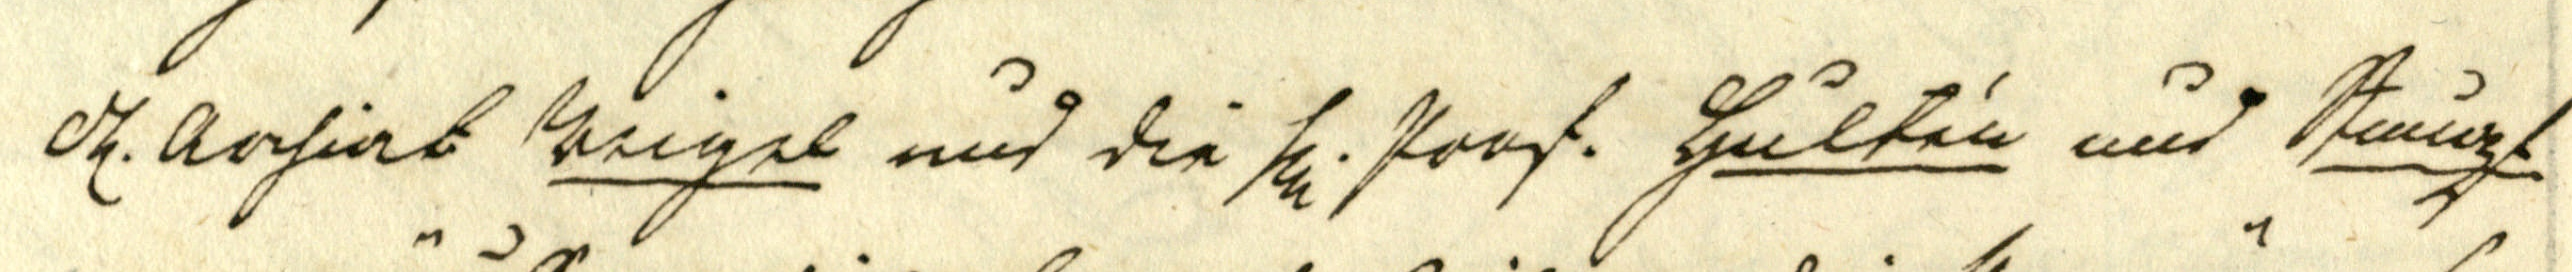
dh Archiat. Weigel und die H. Prof. Hultén und Stumpf
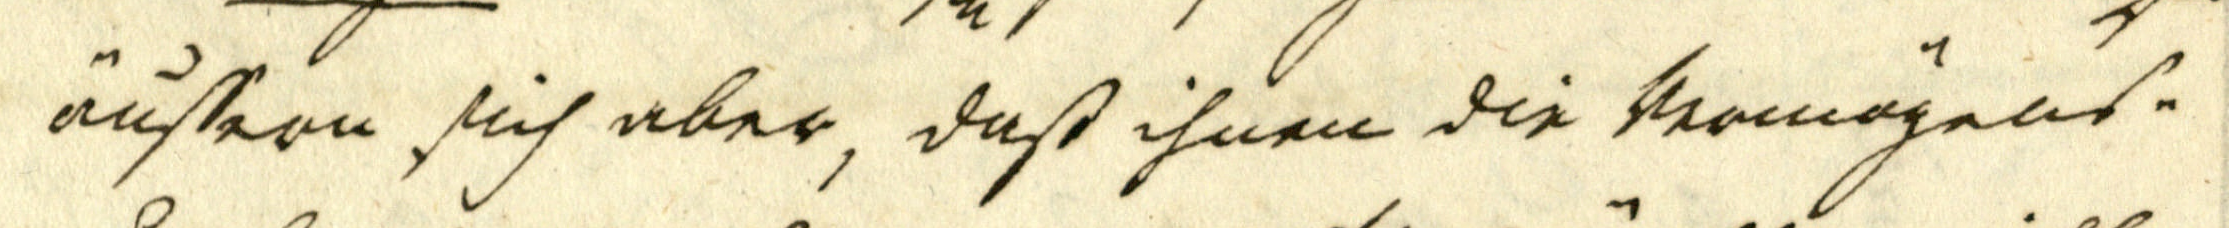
äussern sich aber daß ihnen die Vermögens¬
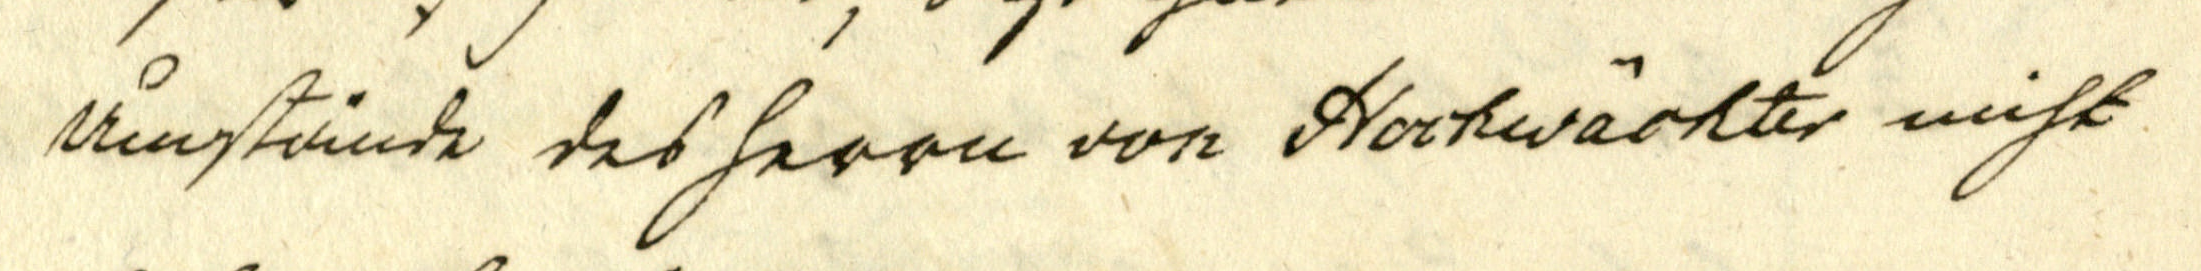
Umstände des Herrn von Hochwächter nicht
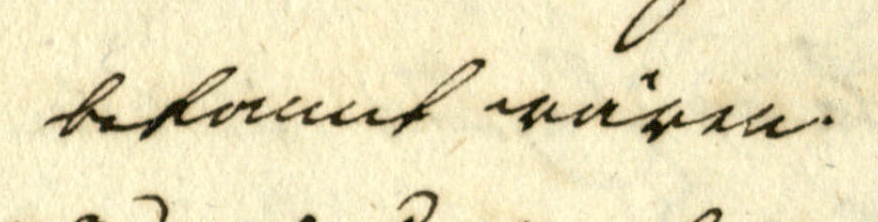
bekannt wären.
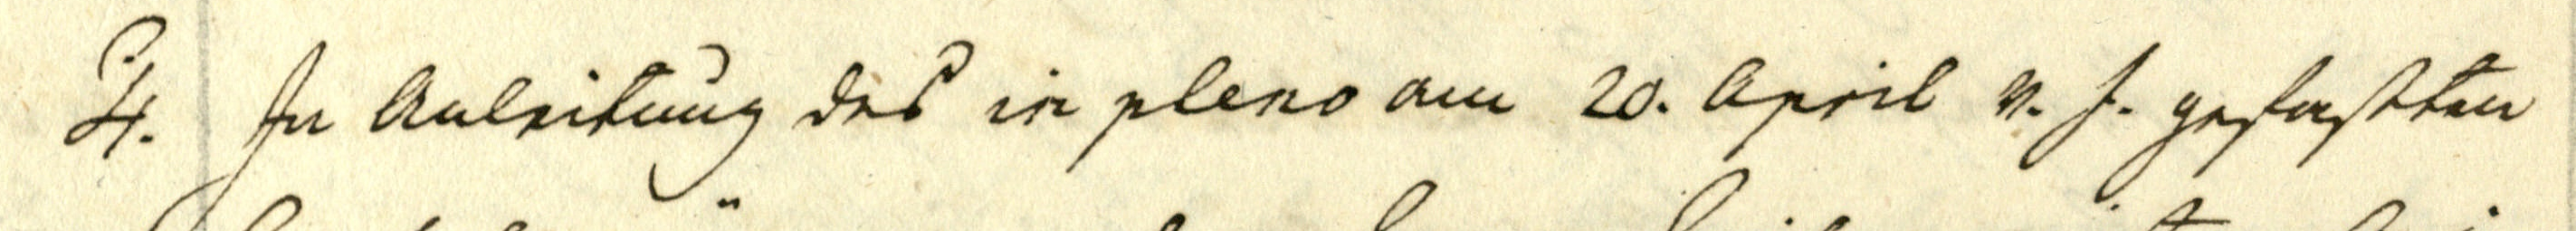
4. In Anleitung des in pleno am 20. April v. J. gefaßten
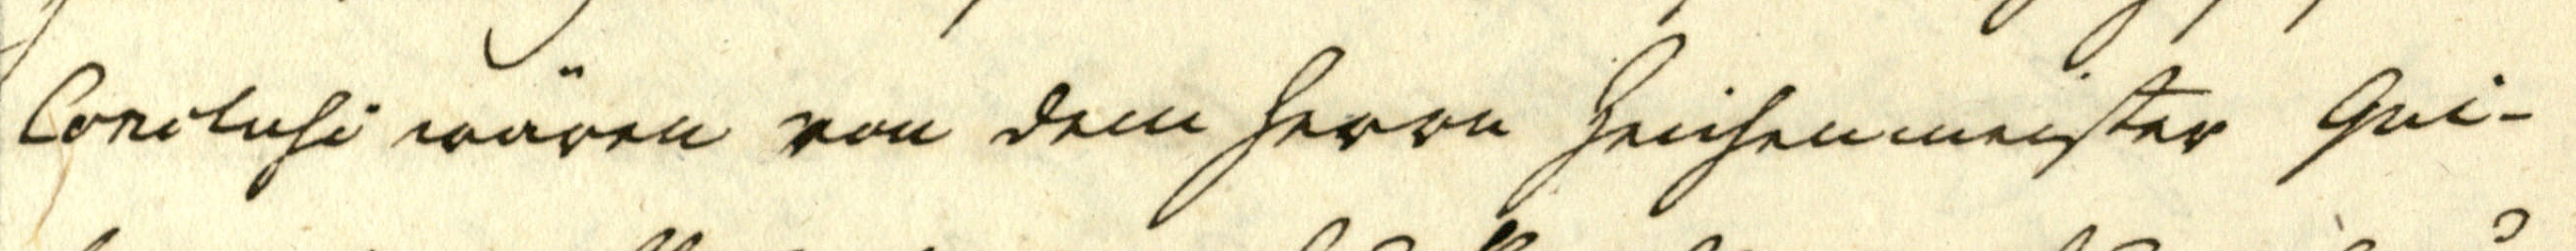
Conclusi wären von dem Herrn Zeichenmeister Qui¬
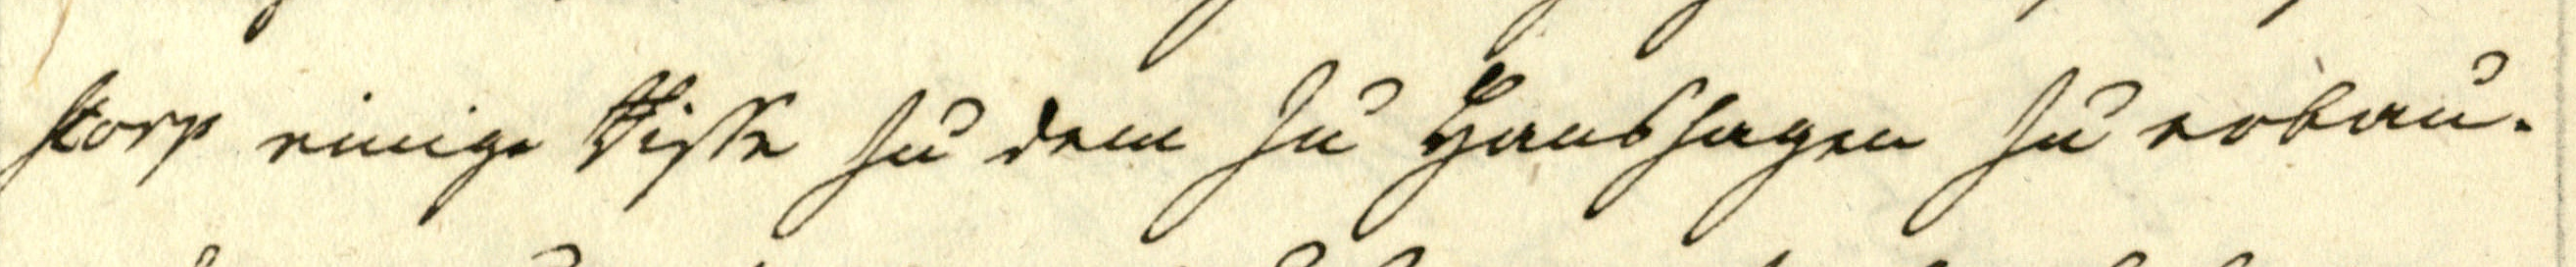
storp einige Risse zu dem zu Hanshagen zu erbau¬
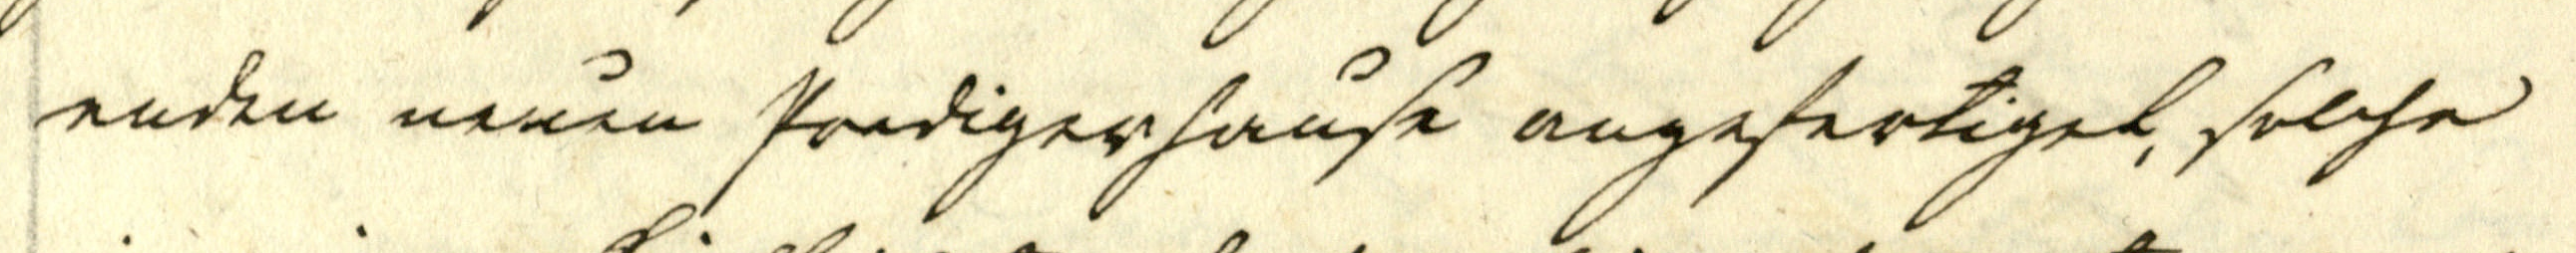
enden neuen Predigerhause angefertiget, solche
